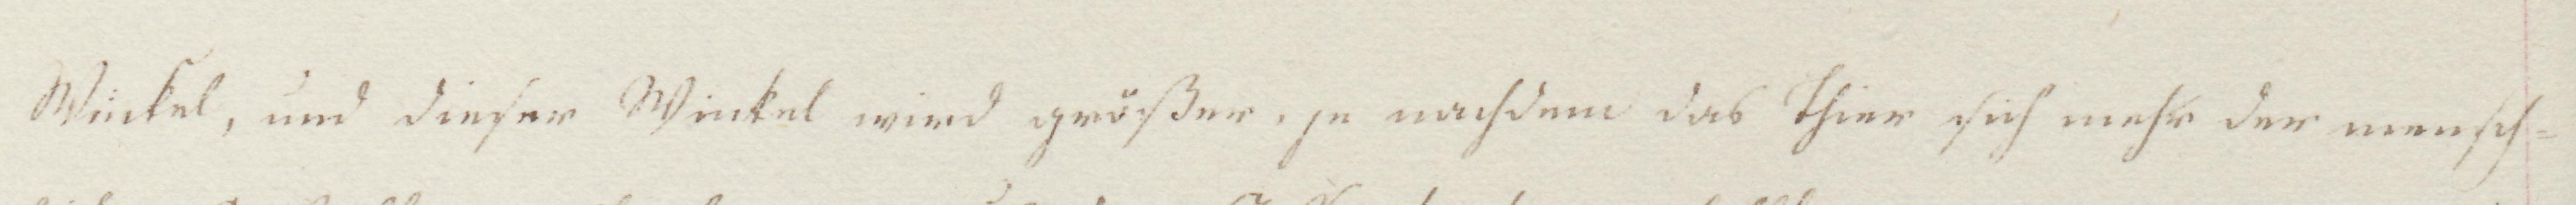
Winkel, und dieser Winkel wird größer, je nachdem das Thier sich mehr der mensch-
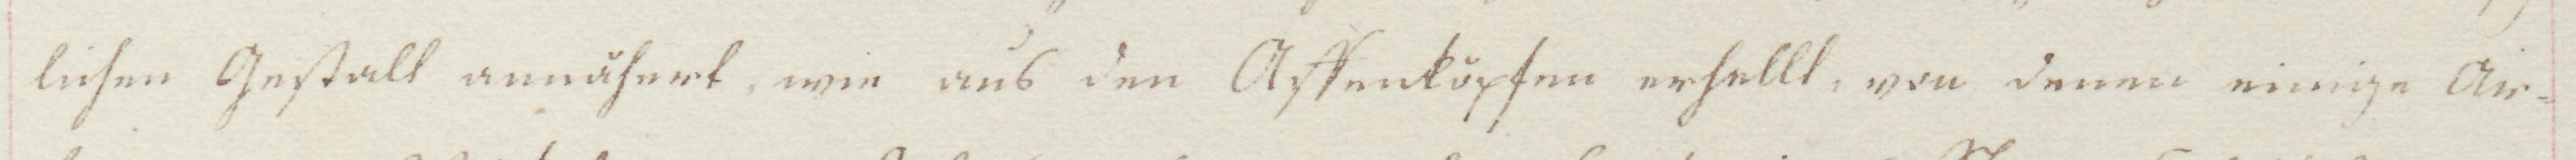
lichen Gestalt annähert, wie aus den Affenköpfen erhellt, von denen einige Ar-
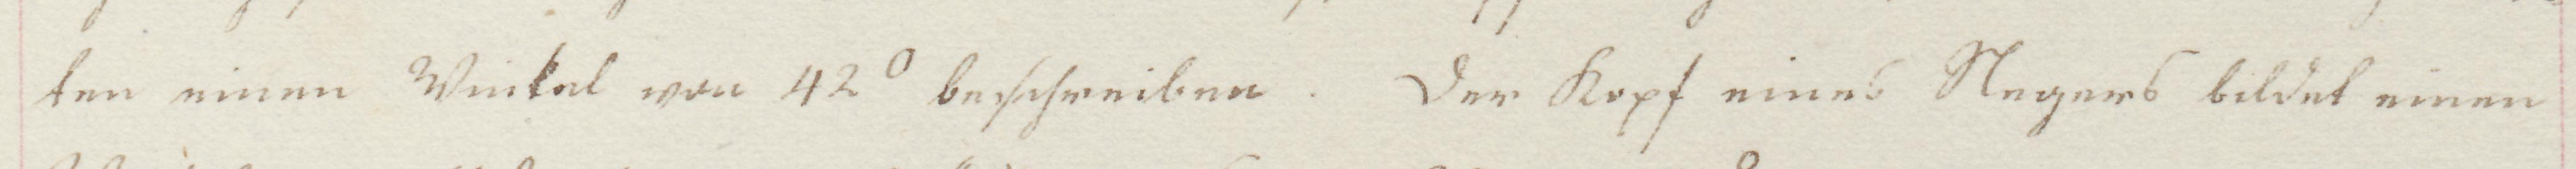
ten einen Winkel von 42° beschreiben. Der Kopf eines Negers bildet einen
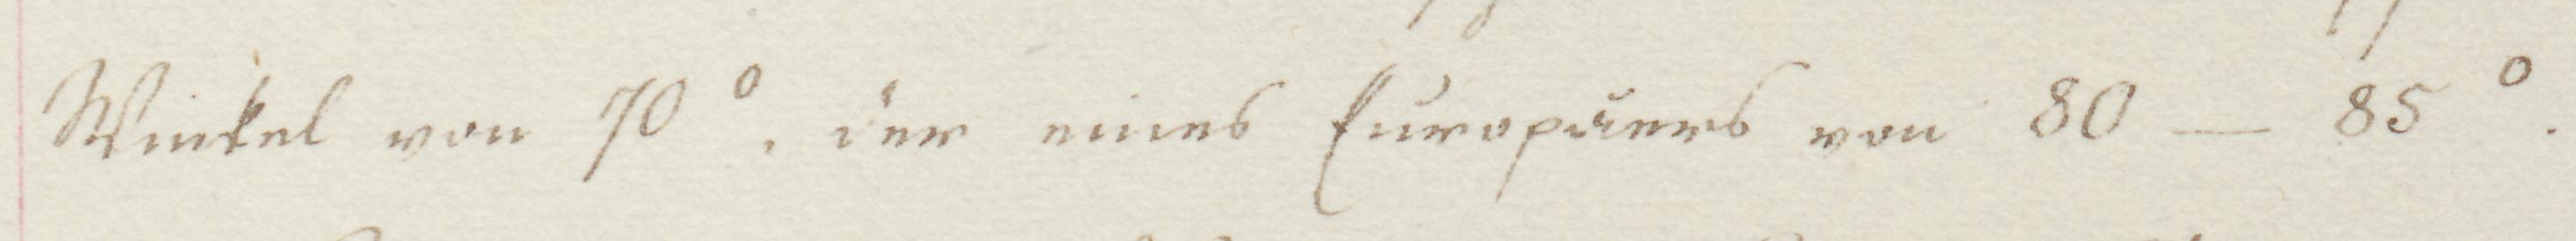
Winkel von 70°, der eines Europäers von 80–85°.
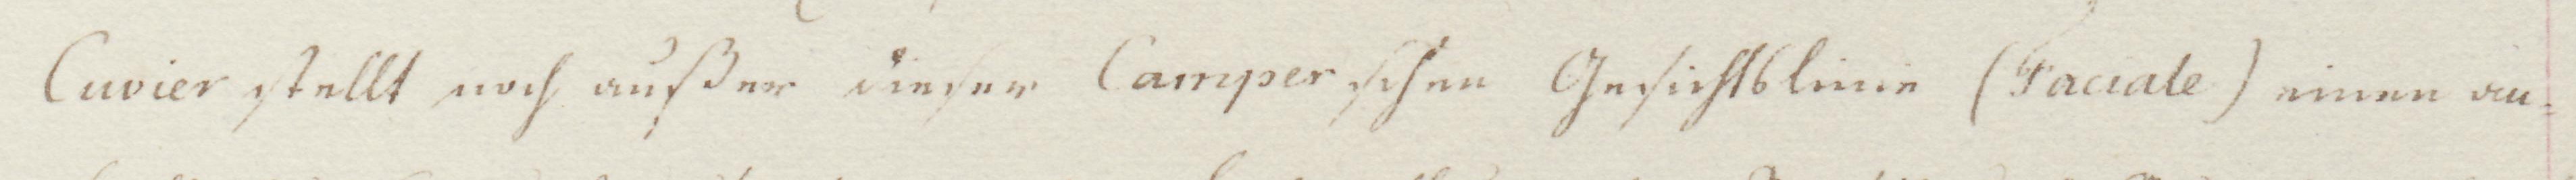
Cuvier stellt noch außer dieser Camperschen Gesichtslinie einen an-
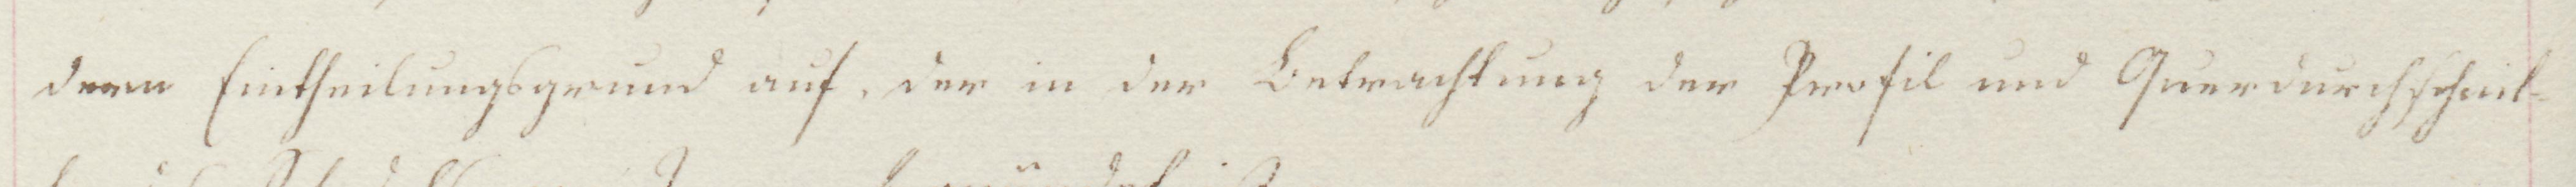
dern Eintheilungsgrund auf, der in der Betrachtung der Profil und Querdurchschnit-
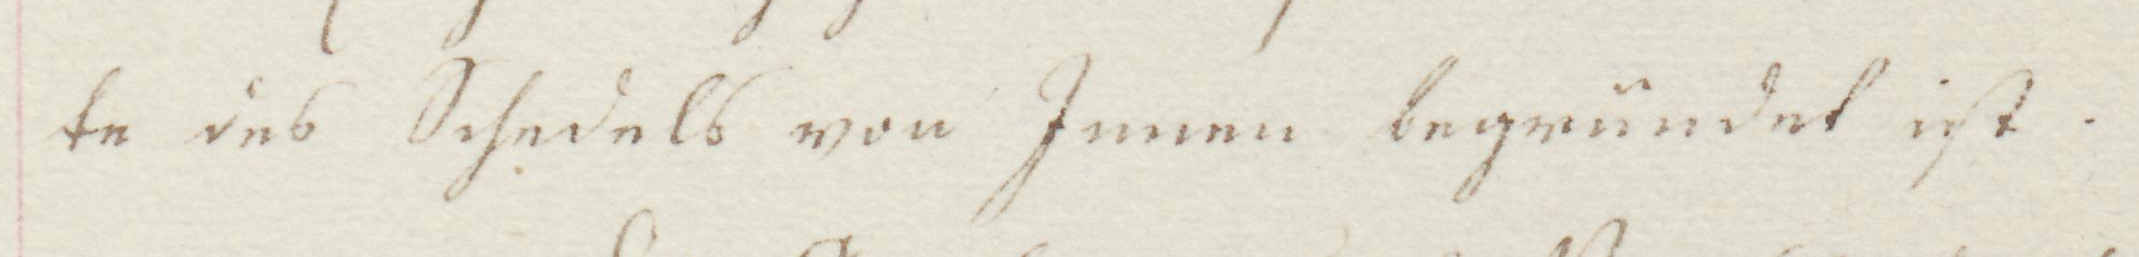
te des Schedels von Innen begründet ist.
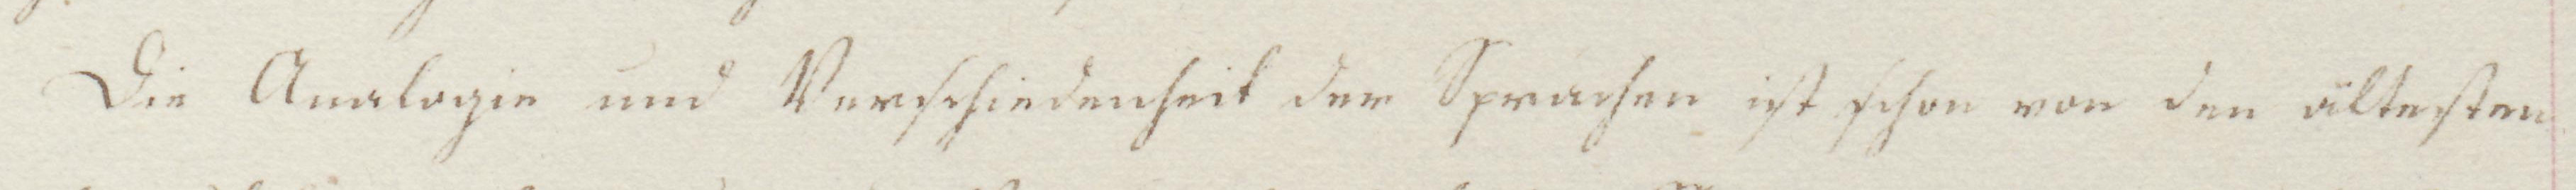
Die Analogie und Verschiedenheit der Sprachen ist schon von den ältesten
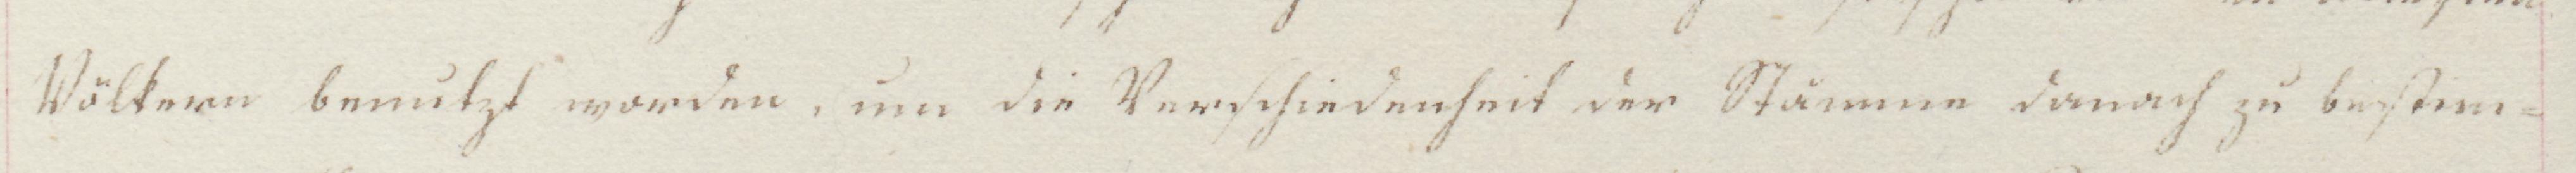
Völkern benutzt worden, um die Verschiedenheit der Stämme danach zu bestim-
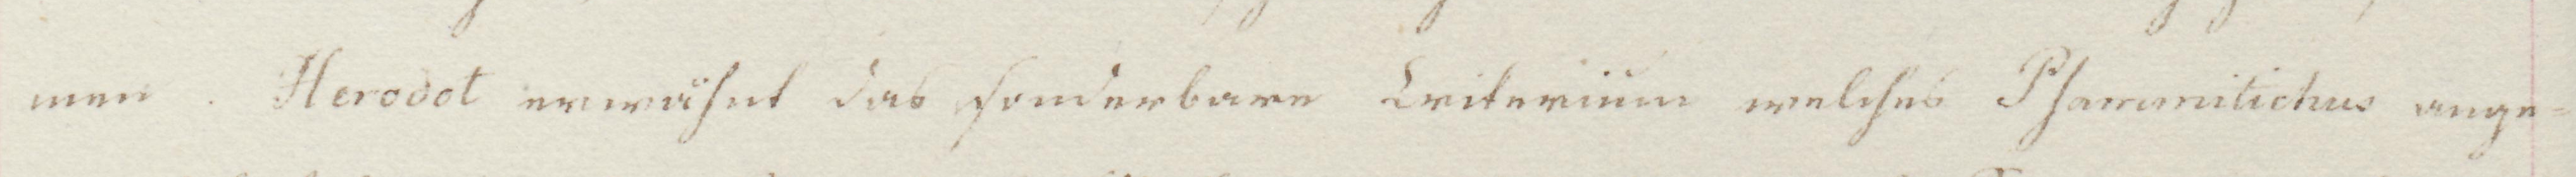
men. Herodot erwähnt das sonderbare Criterium welches Pharranitichus ange-
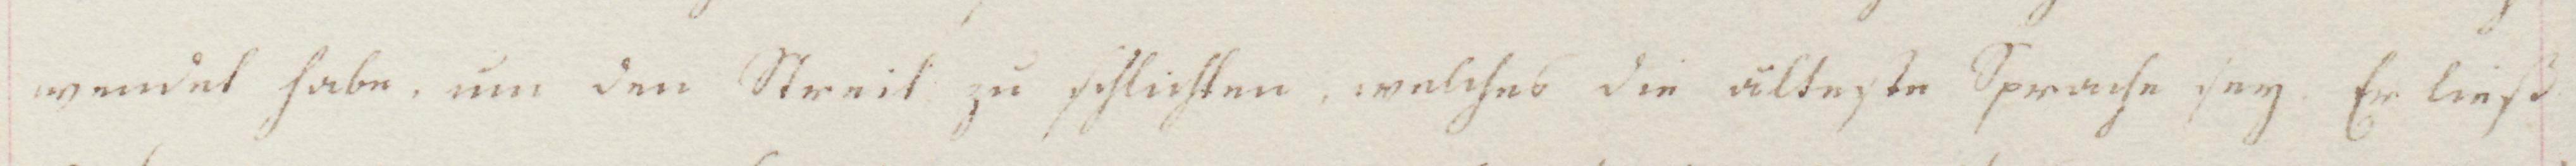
wendet habe, um den Streit zu schlichten, welches die älteste Sprache sey. Er ließ
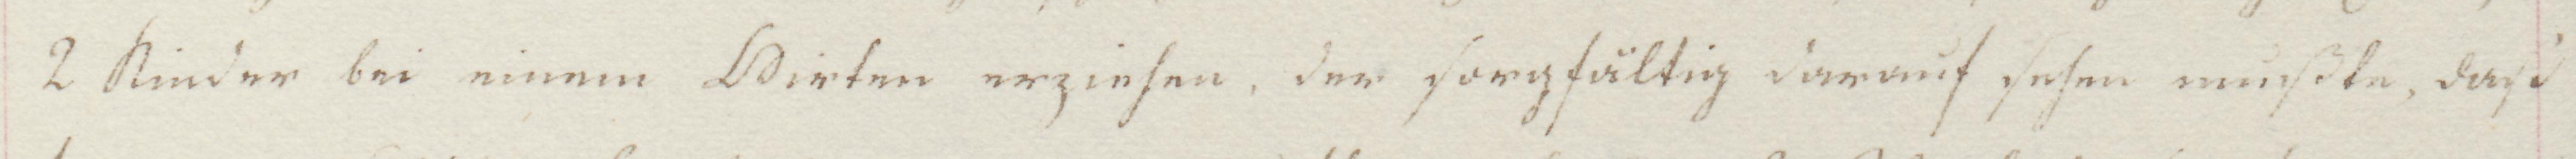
2 Kinder bei einem Hirten erziehen, der sorgfältig darauf sehen mußte, daß
